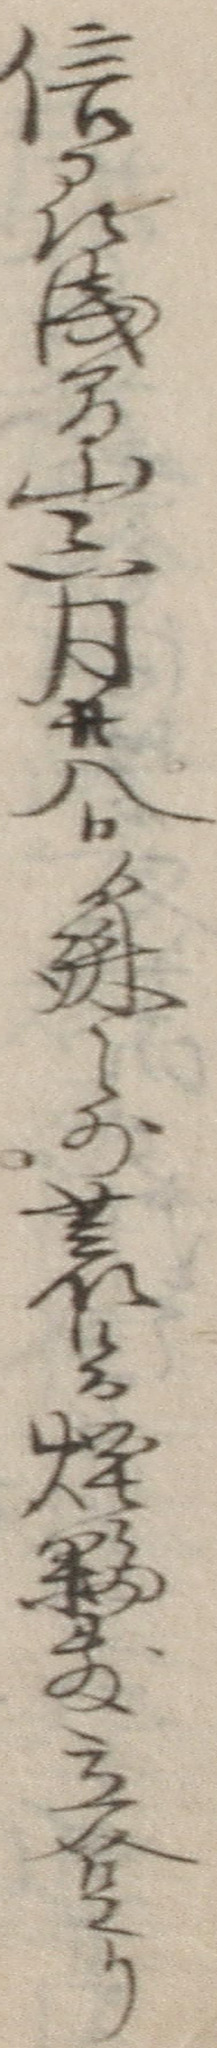信州浅間山六月廿八日ゟ礫之外荒候而煙夥敷立登り
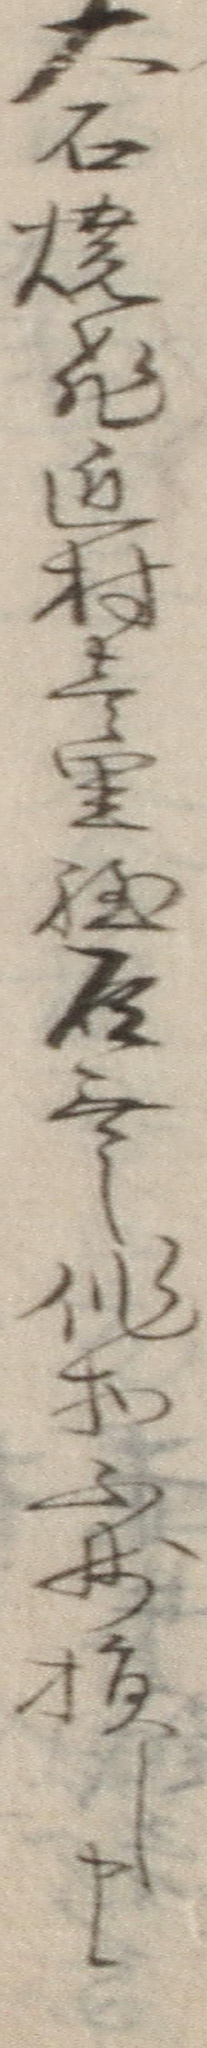大石焼飛近村壱里程道無之作物不残損し申候
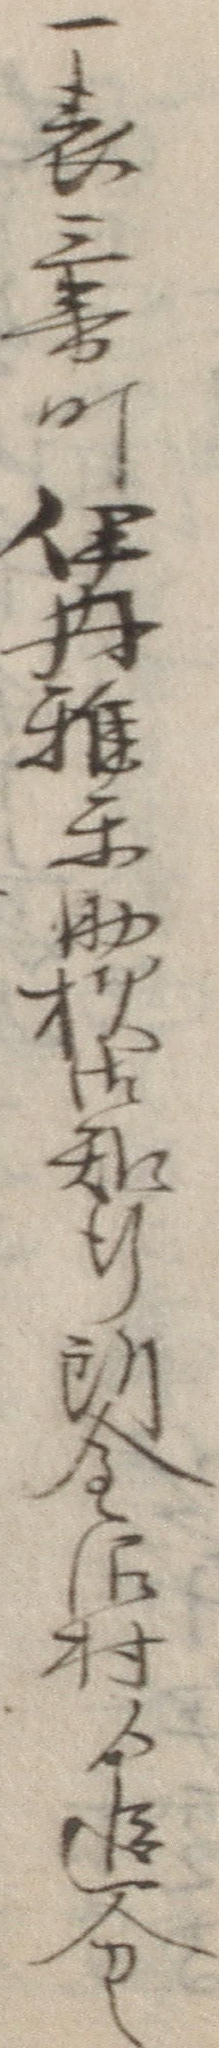一表三番町伊丹雅楽助様御知行所金沼村ゟ追分之
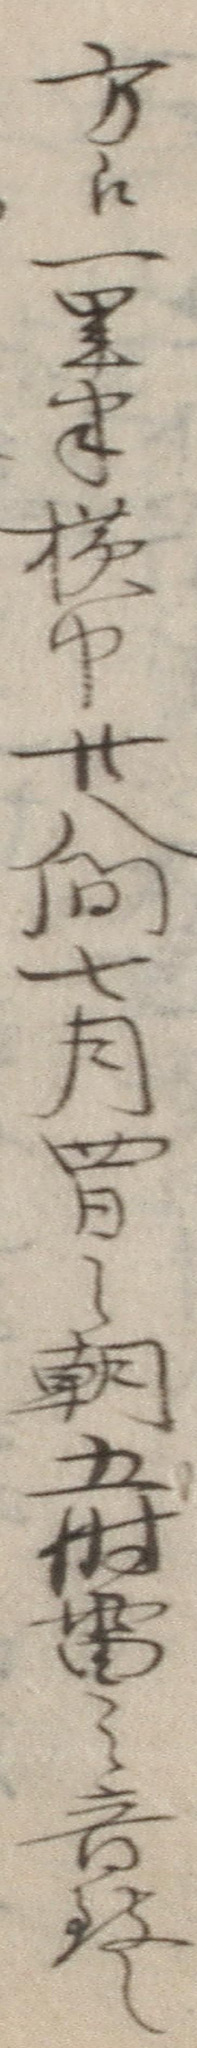方え一里半横巾廿八間七月四日之朝五時雷之音致し
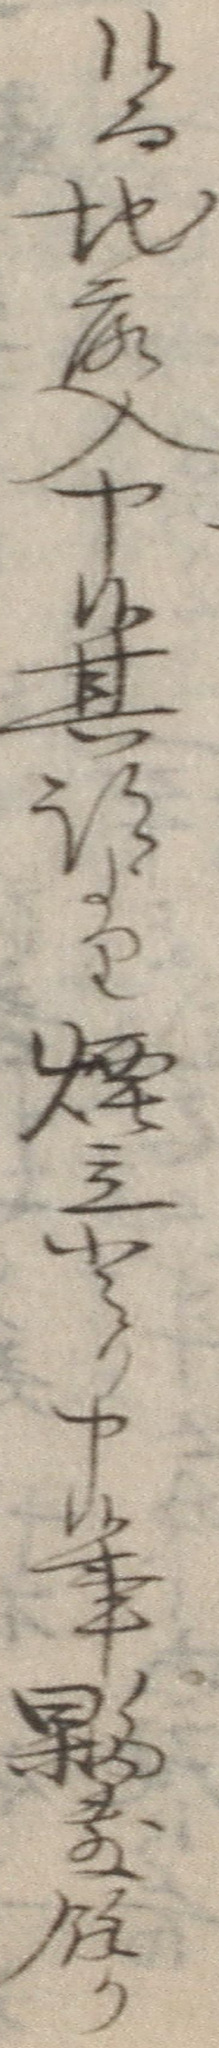候而地落入申候其跡より煙立登り申候事夥敷餘り
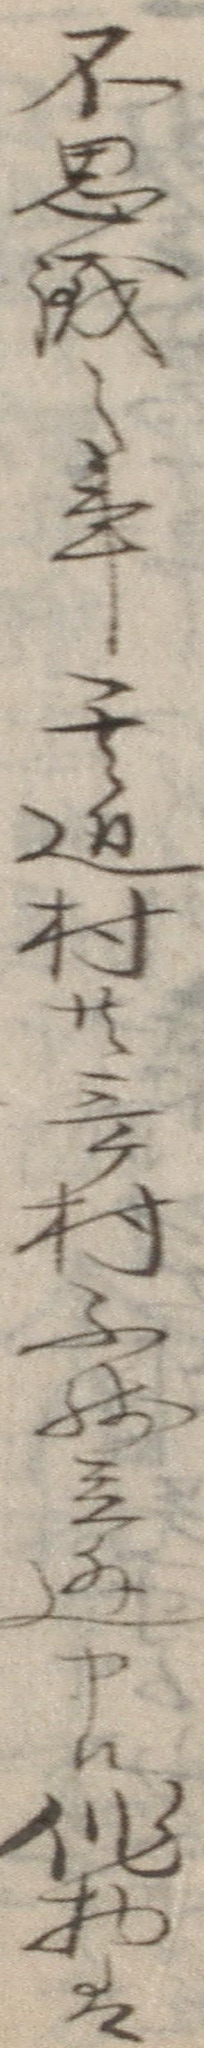不思議之事其近村共三ケ村ふ残立逃申候作物は
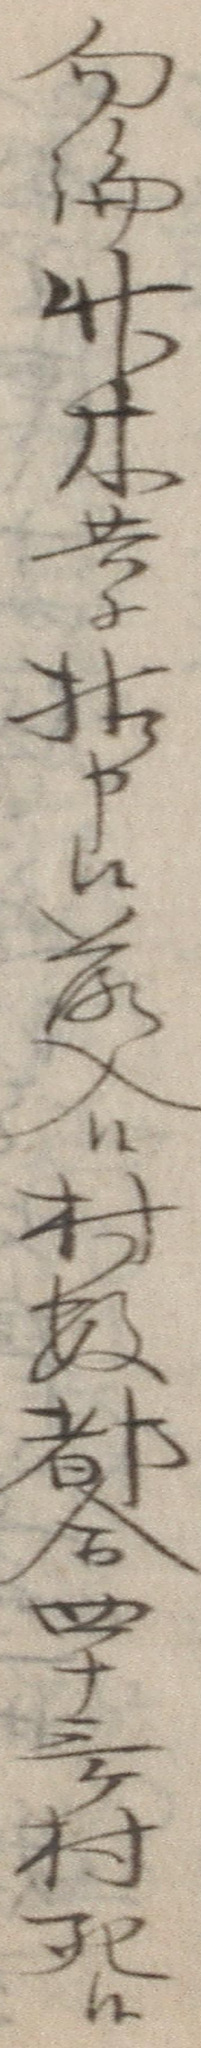勿論竹木共に枯申候落入候村数都合四十三ケ村死候
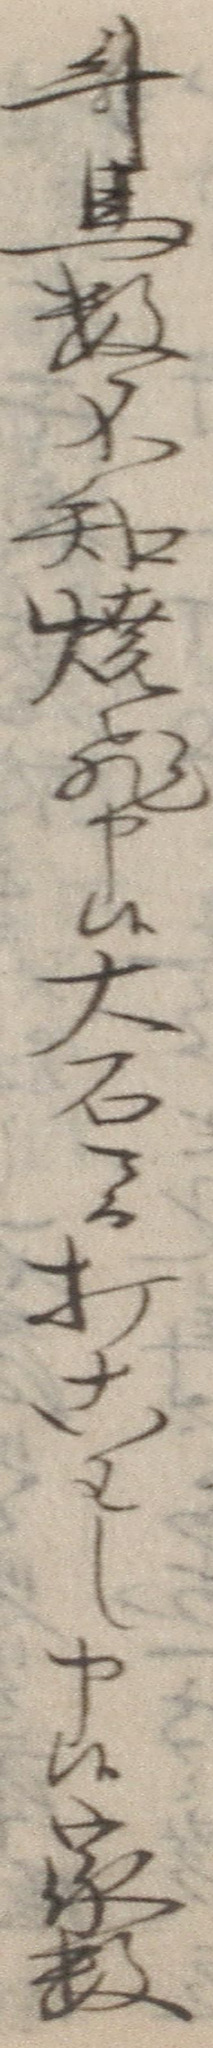牛馬数不知焼飛申候大石ニ而打こわし申候家数
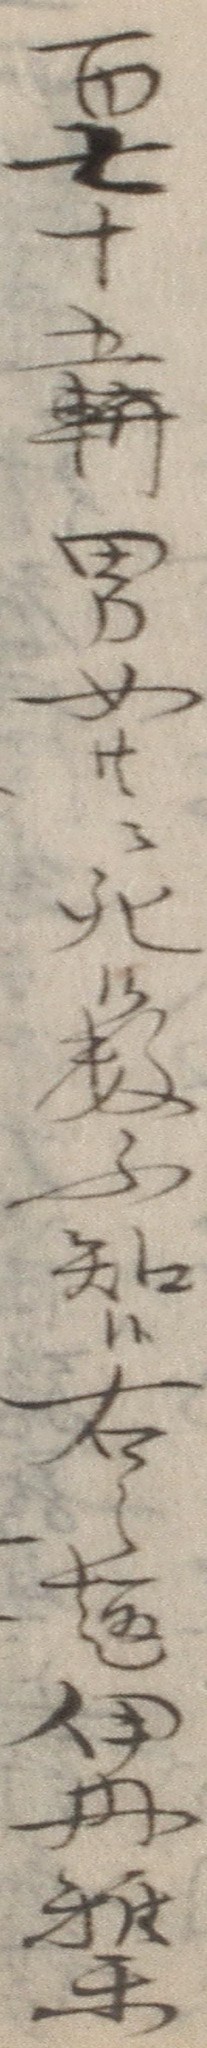百七十五軒男女共ニ死候数不知候右之趣伊丹雅楽
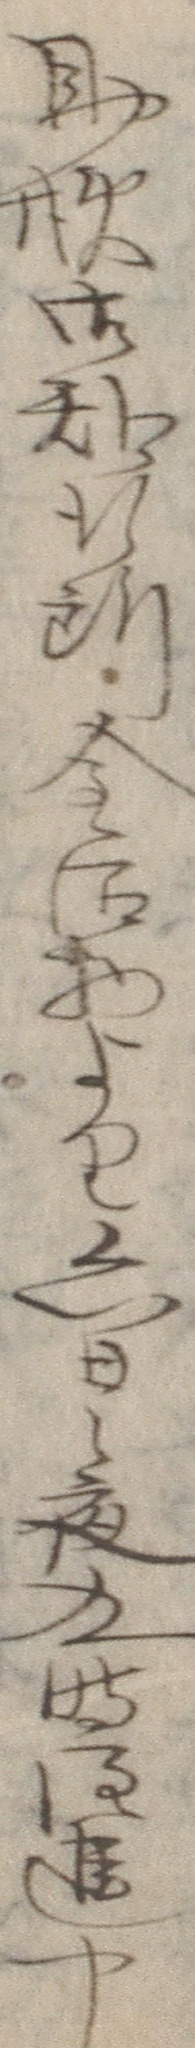助様御知行所金沼村より六日之夜九時注進申
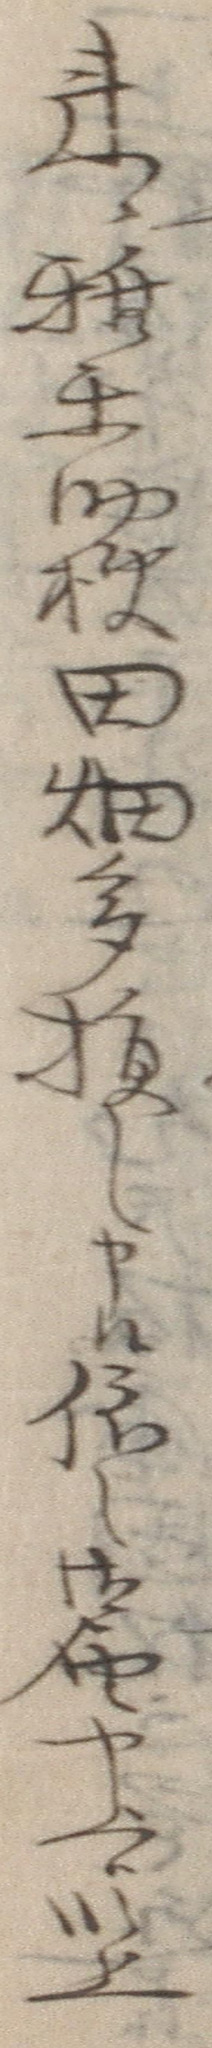来候雅楽助様田畑多損し申候依之御届申上候以上
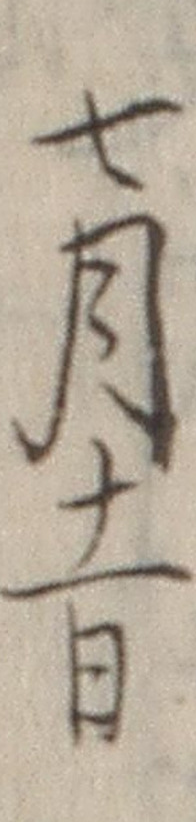七月十一日
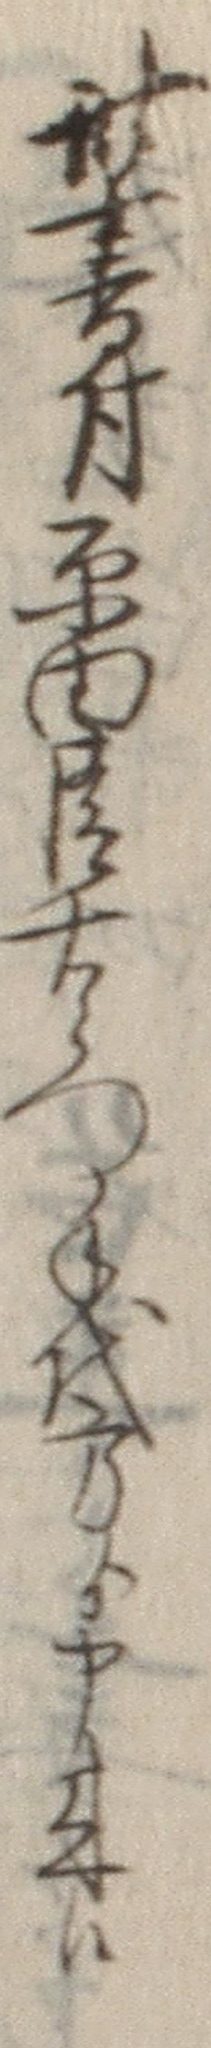此書付原田清右衛門手代方ゟ申来候
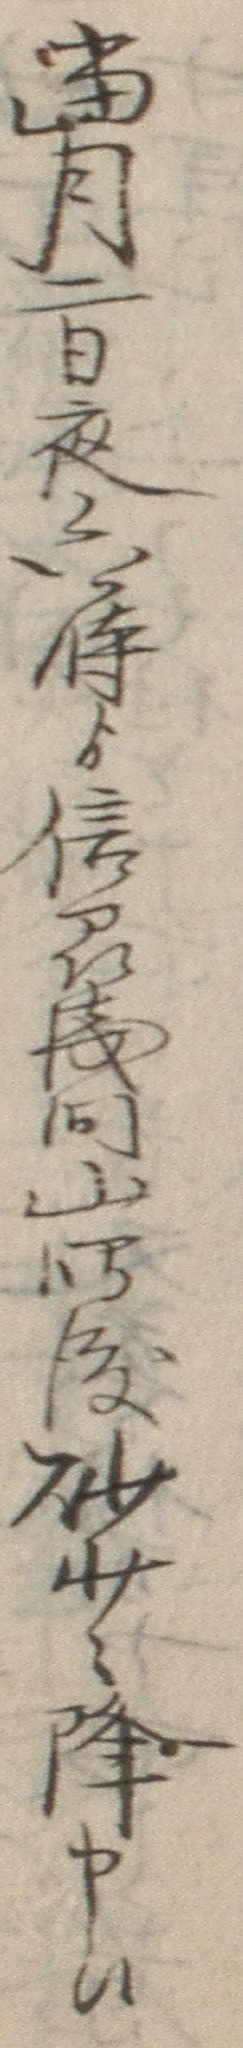当月二日夜六時ゟ信州浅間山鳴後砂少々降申候
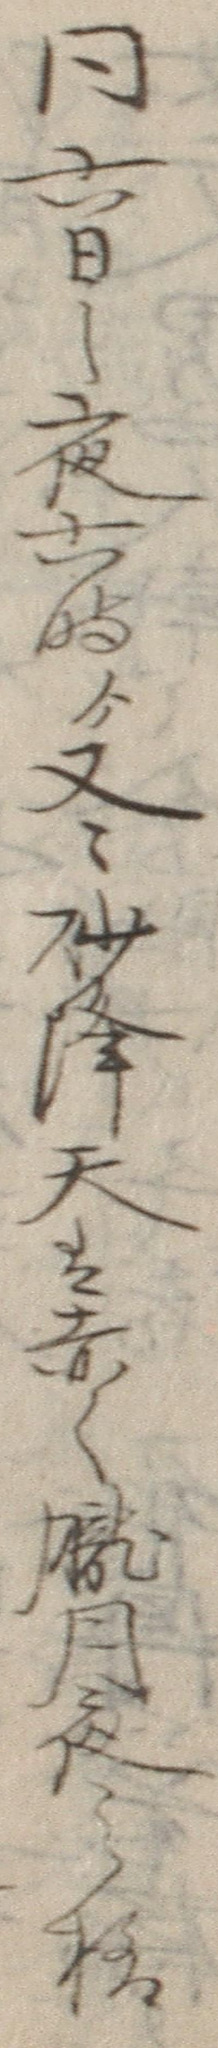同六日之夜六時ゟ又々砂降天は赤〳〵朧月夜之様
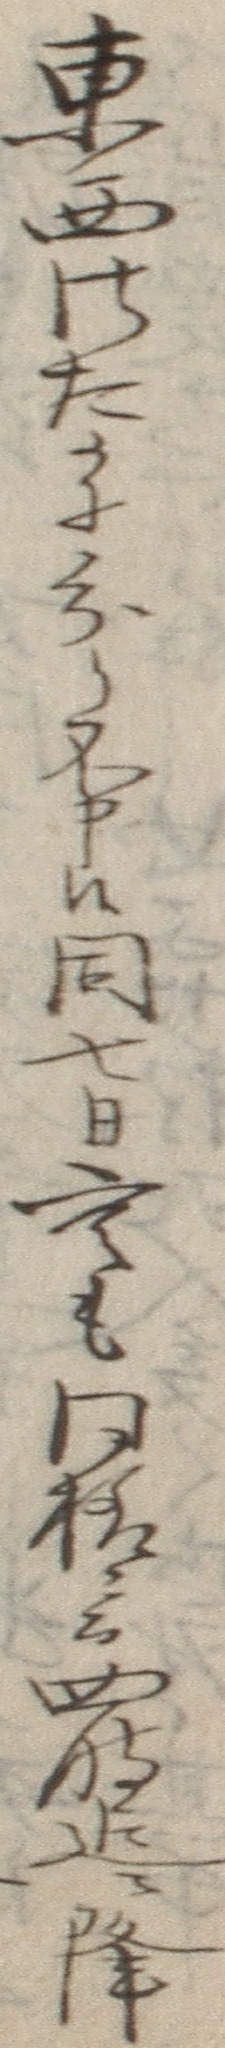東西のさたかに分り不申候同七日空も同様ニ而四時迄降
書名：[諸国災害記録]
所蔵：東京大学地震研究所図書室 Earthquake Research Institute Library, The University of Tokyo, JAPAN
